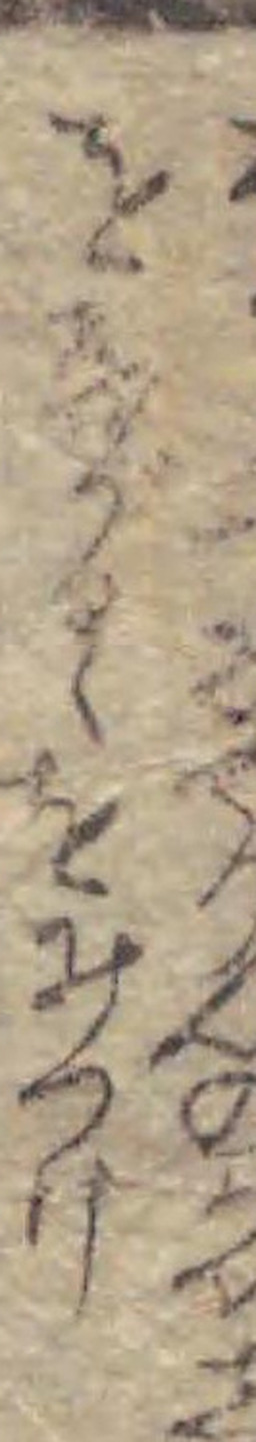をながるゝをみつけ
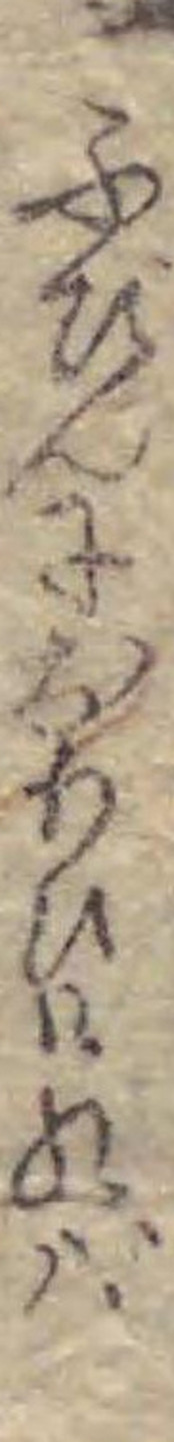ふびんにおもひければ
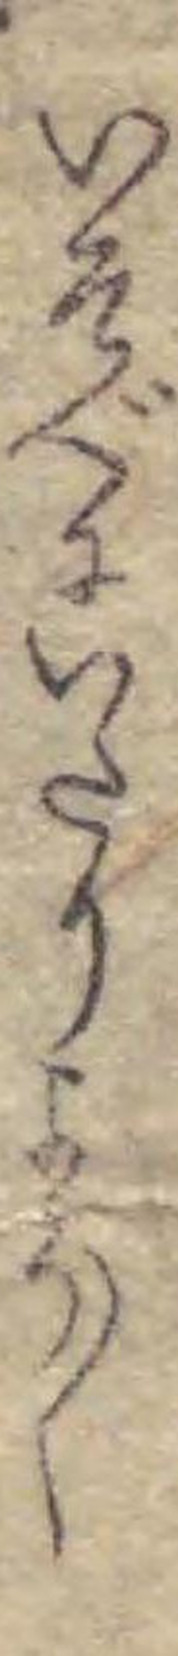いそぐにいたりよう〳〵
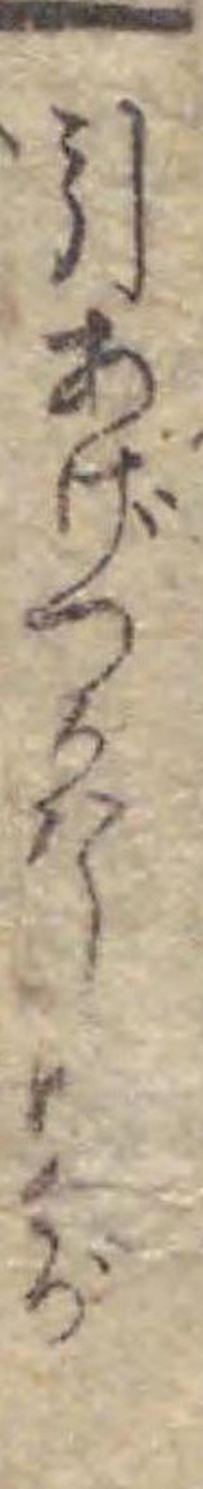引あげつかはしが
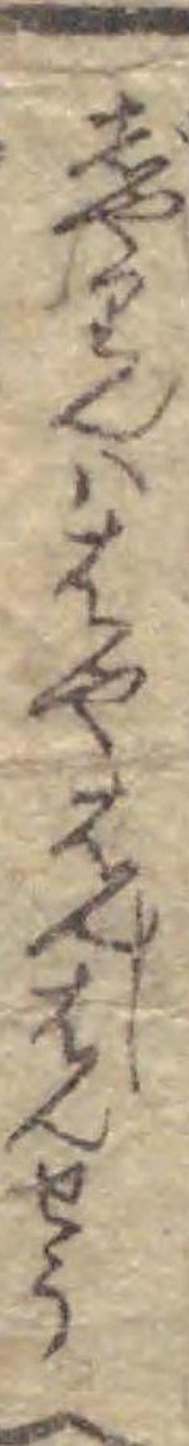じやりんははやはんしはんせう
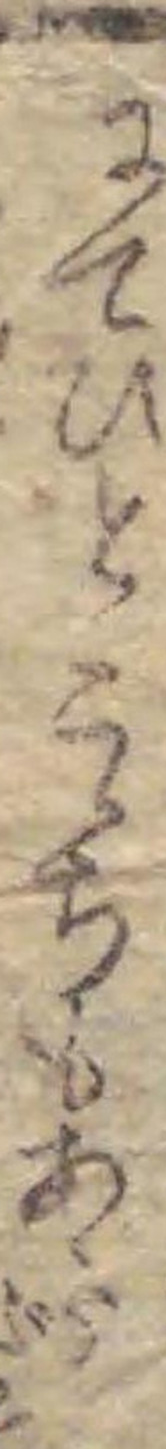にてひとこゝちもあら
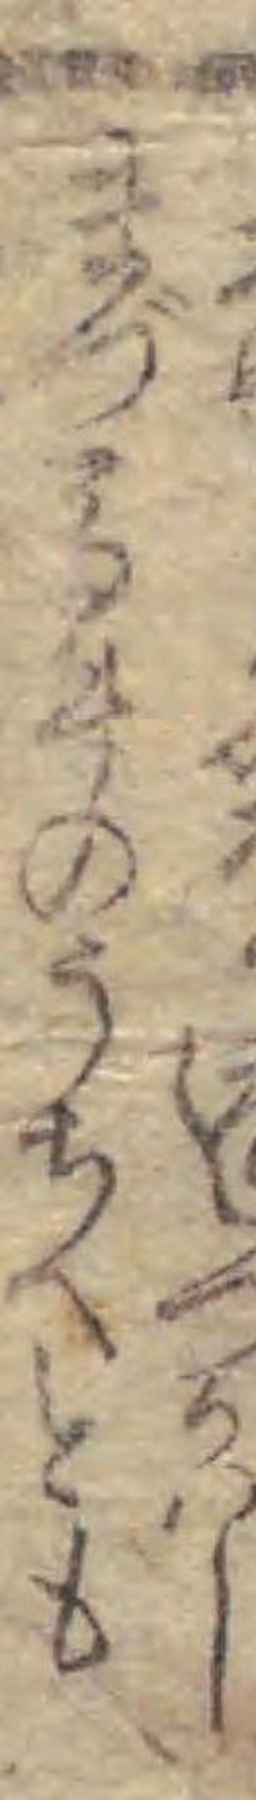まづ馬斗のうちへとも
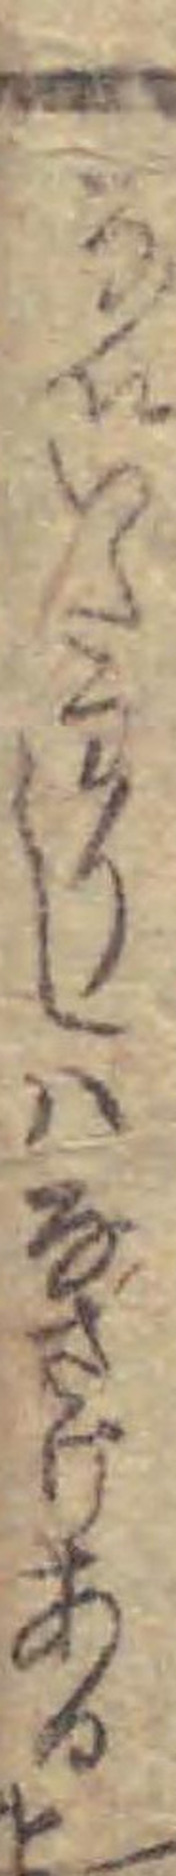ないいたわりしはなさけある
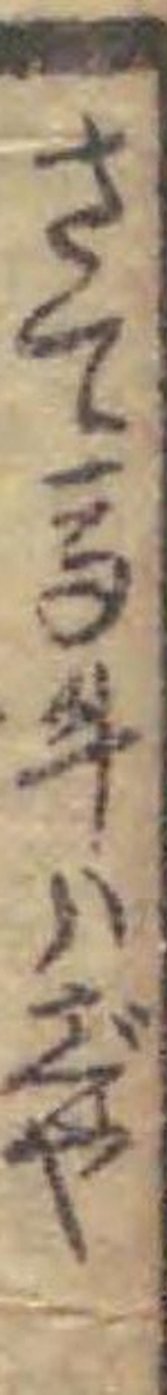さて馬はじや
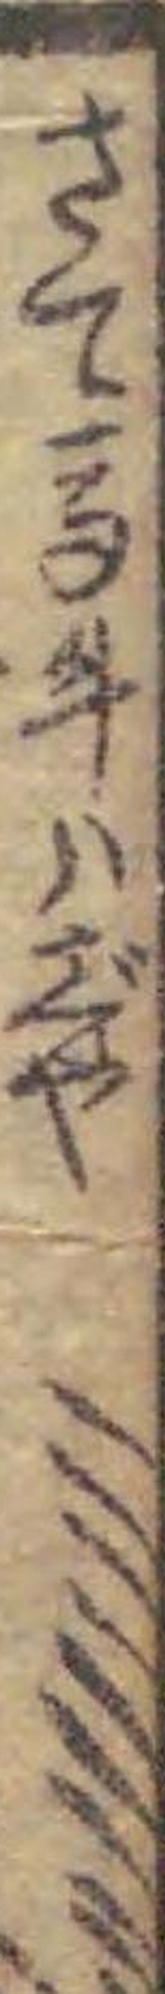さて馬はじや
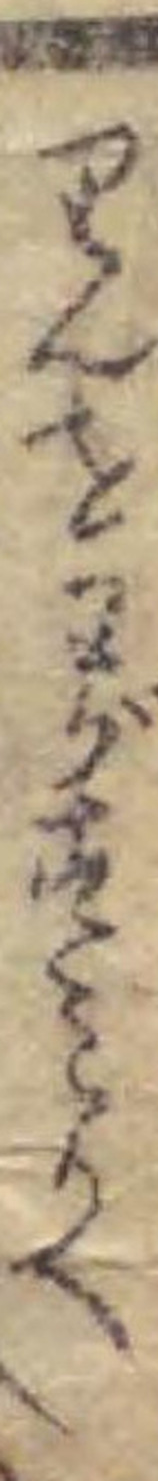りんをわがすみかへ
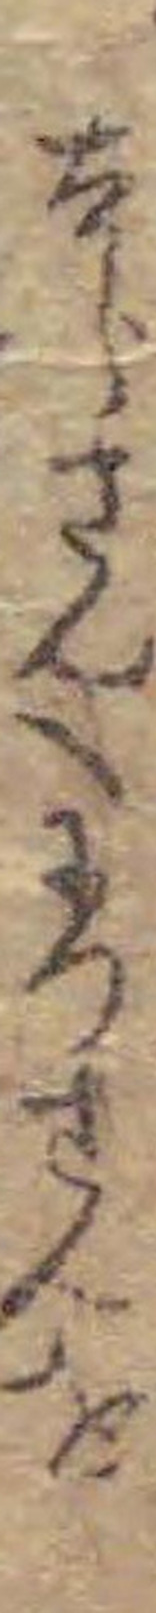太郎さんへにつさんを
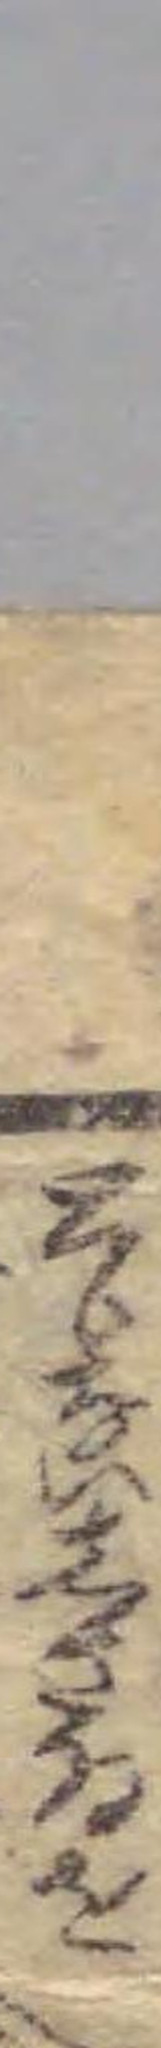ともないしさゐを
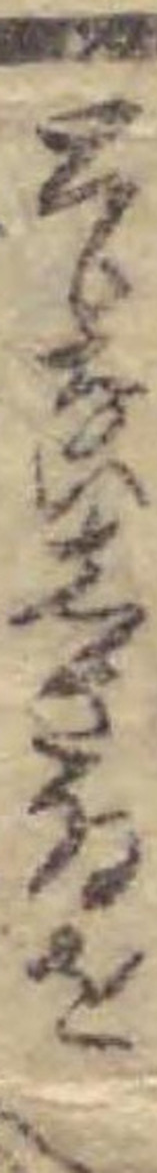ともないしさゐを
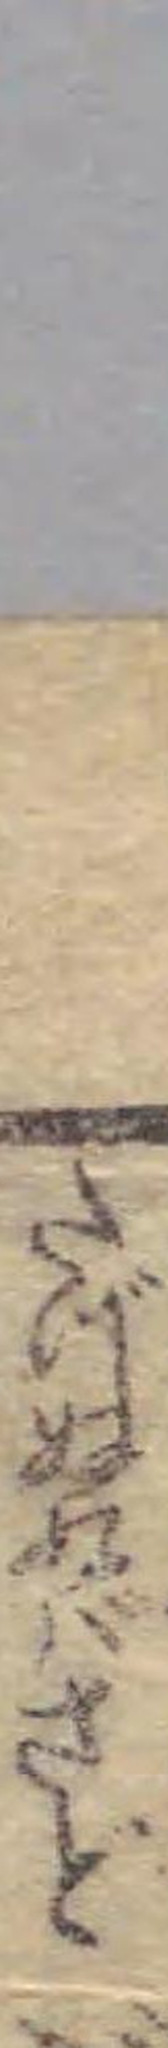たづぬればさど
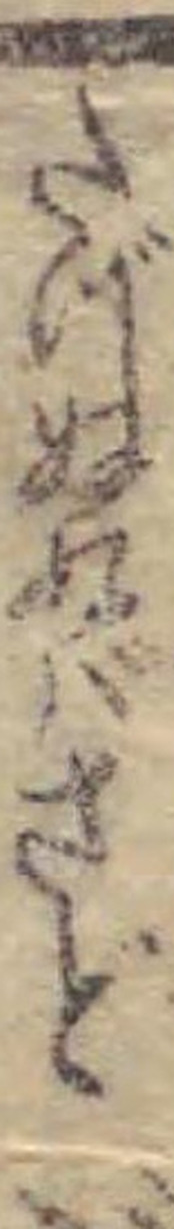たづぬればさど
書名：化物世界夜半嵐 : 3巻
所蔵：国立国会図書館 National Diet Library, JAPAN
